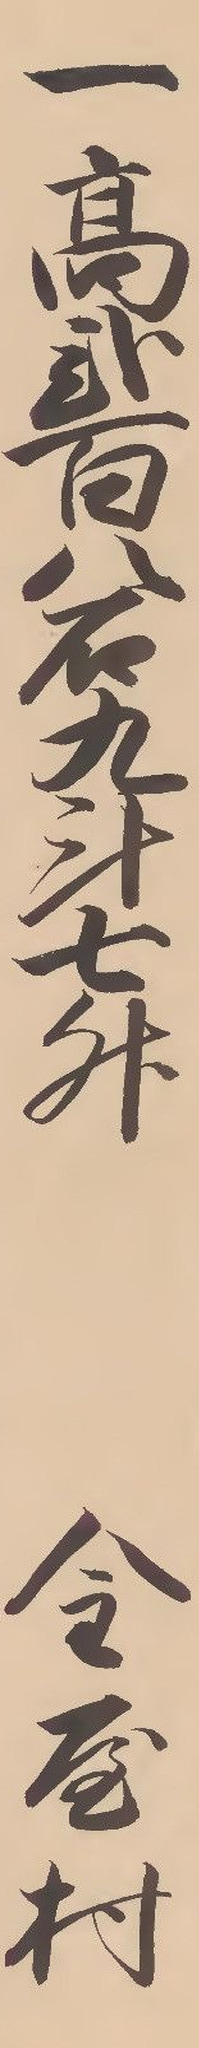一高弐百八石九斗七升金屋村
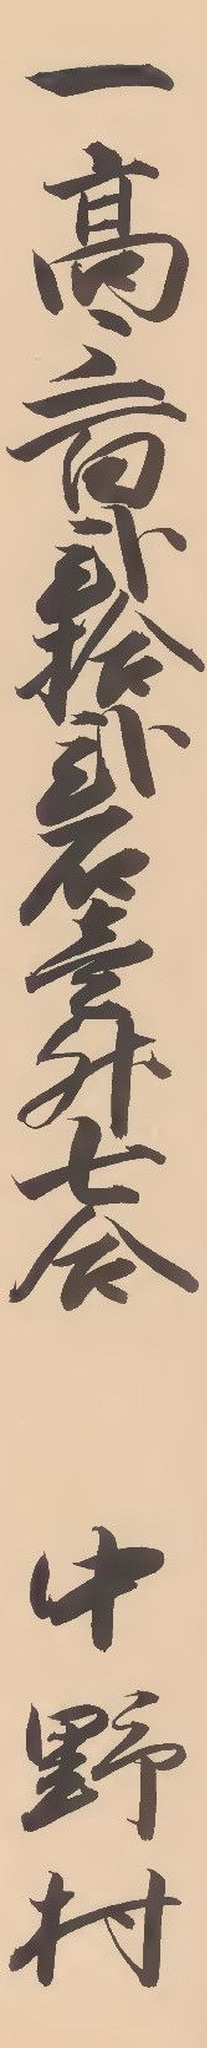一高三百弐拾弐石壱升七合中野村
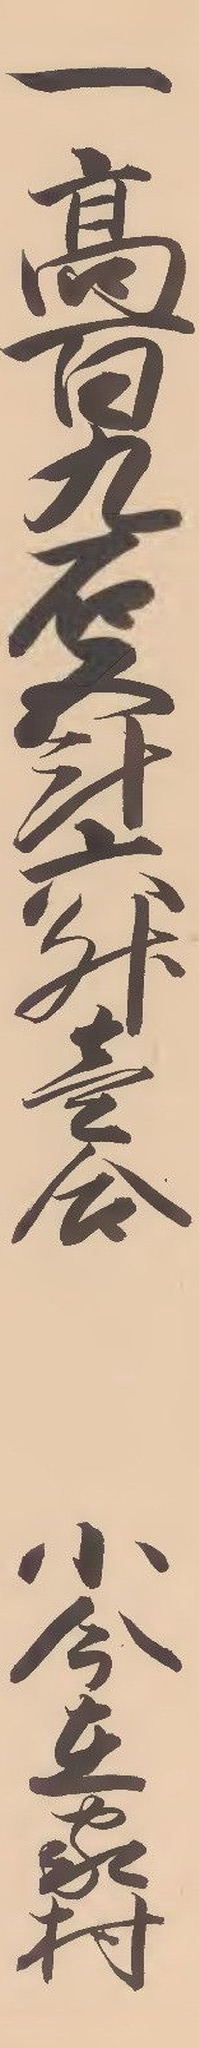一高百九石五斗六升壱合小今在家村
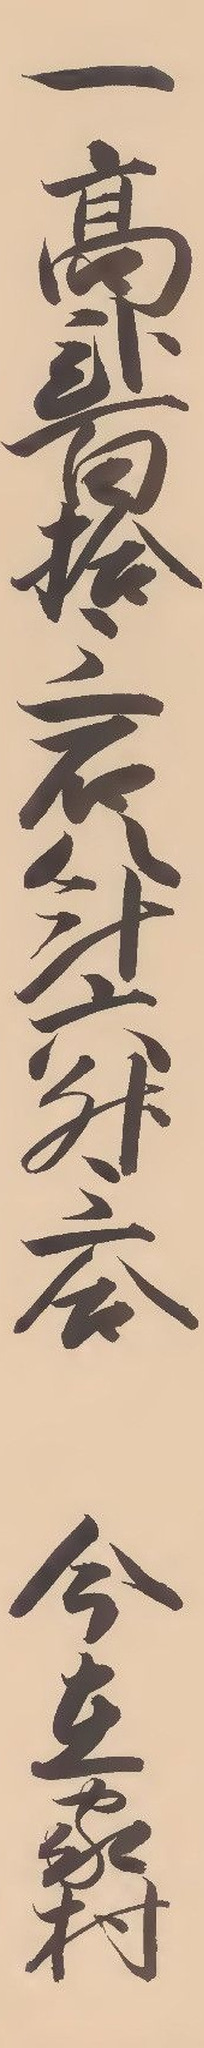一高弐百拾三石八斗六升三合今在家村
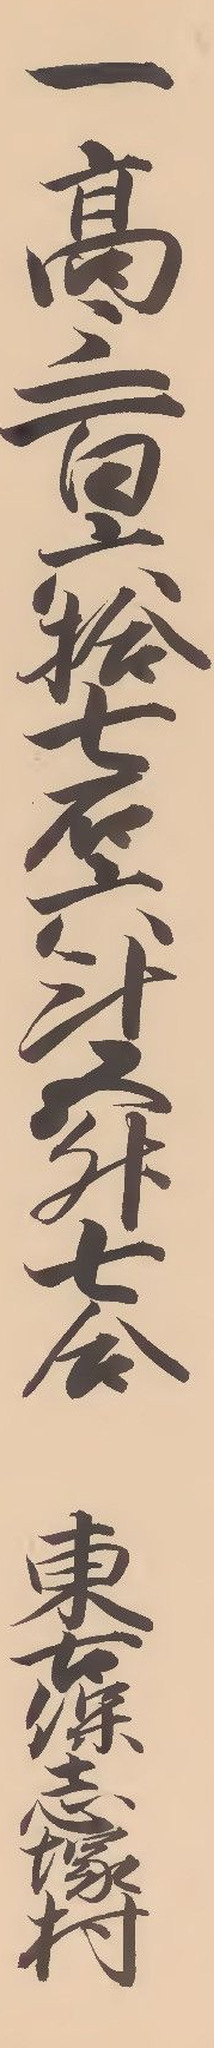一高三百六拾七石六斗五升七合東古保志塚村

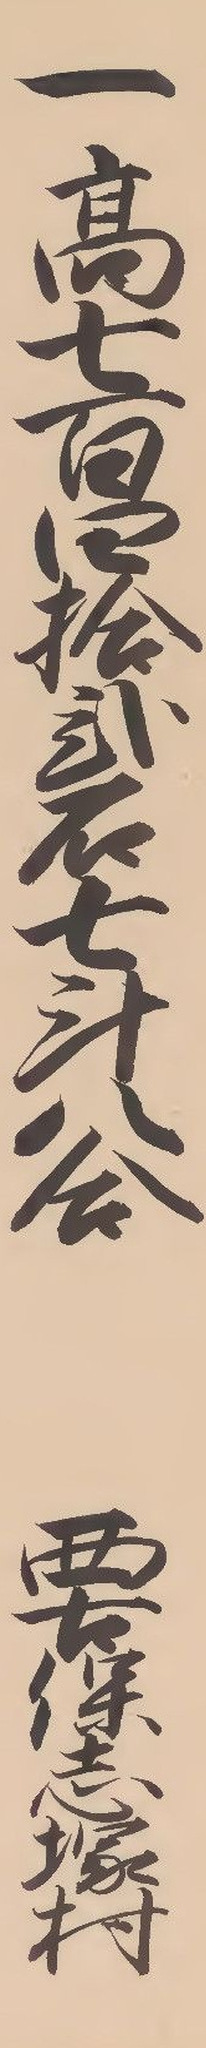一高七百四拾弐石七斗八合西古保志塚村
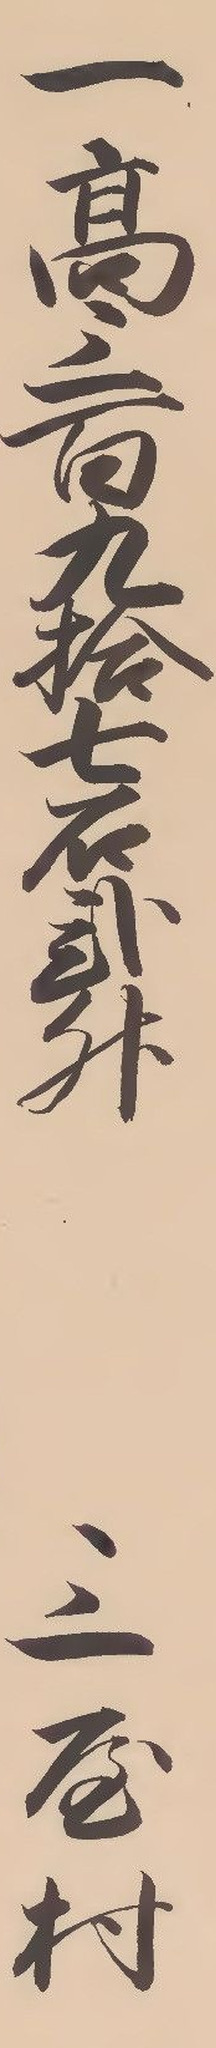一高三百九拾七石弐升三屋村
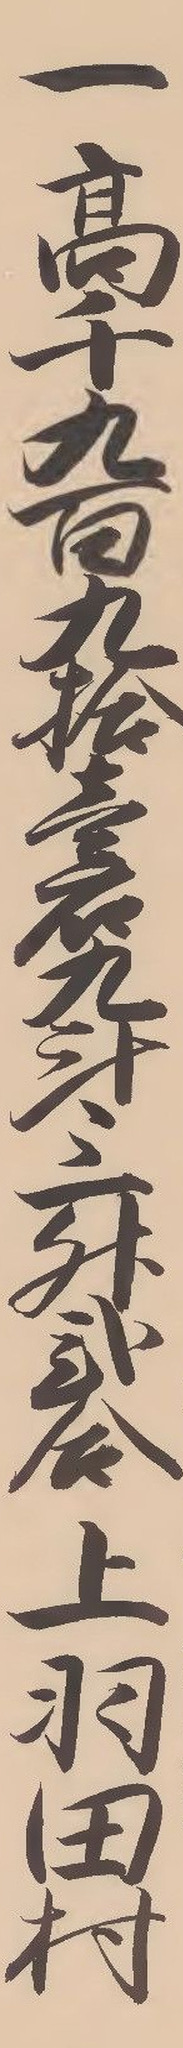一高千九百九拾壱石九斗三升弐合上羽田村
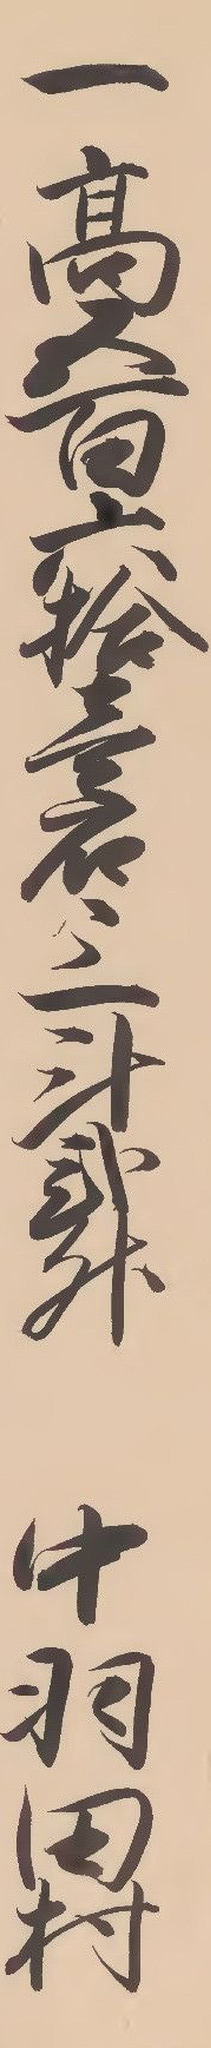一高五百六拾壱石三斗弐升中羽田村
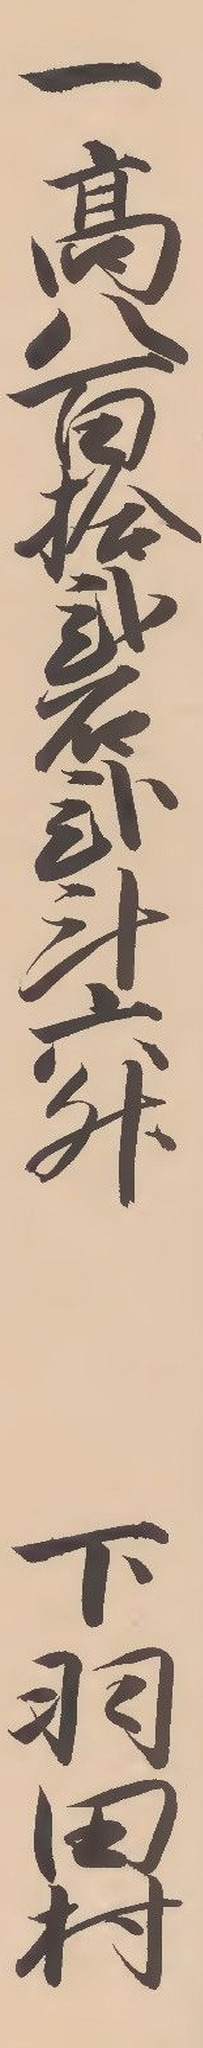一高八百拾弐石弐斗六升下羽田村
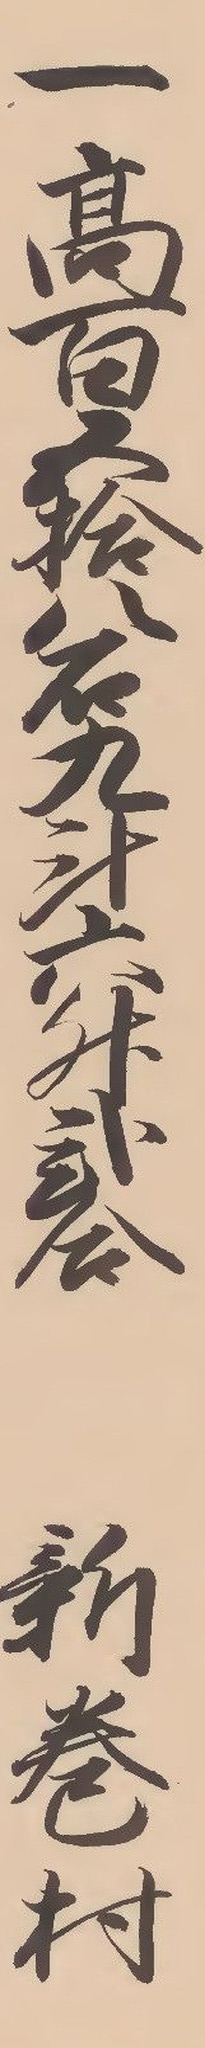一高百五拾八石九斗六升弐合新巻村
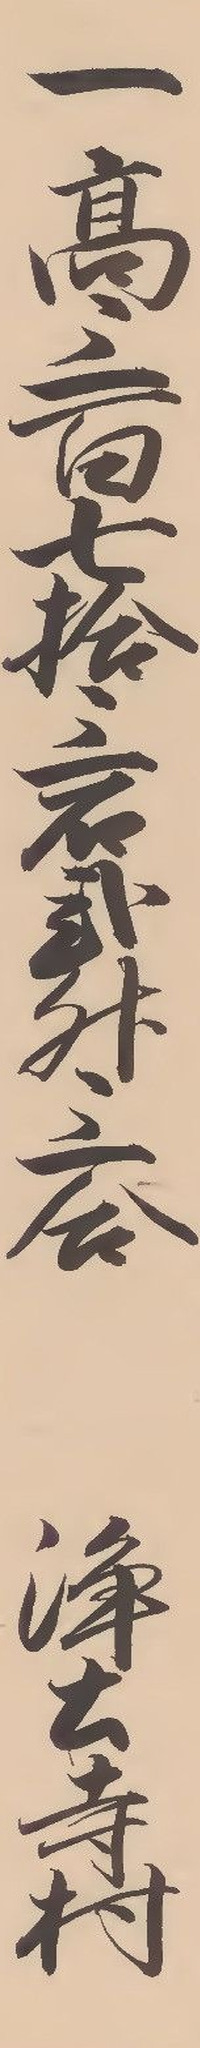一高三百七拾三石弐升三合浄土寺村
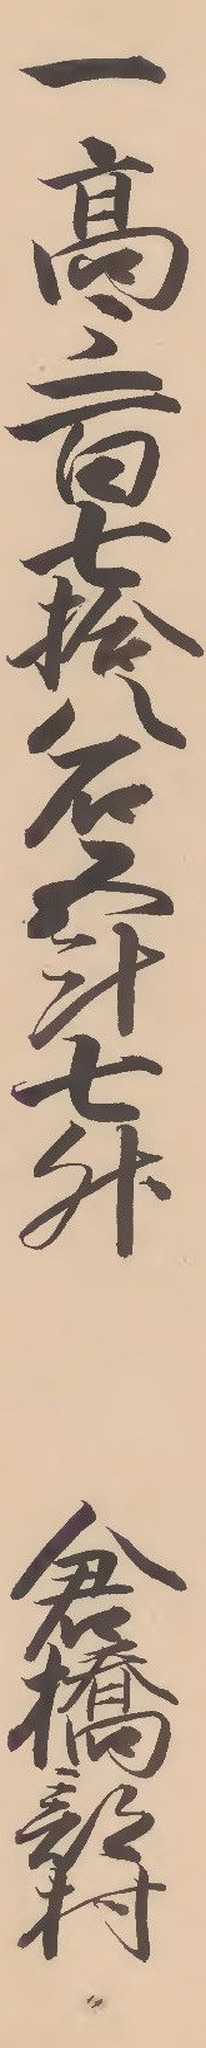一高三百七拾八石五斗七升倉橋部村

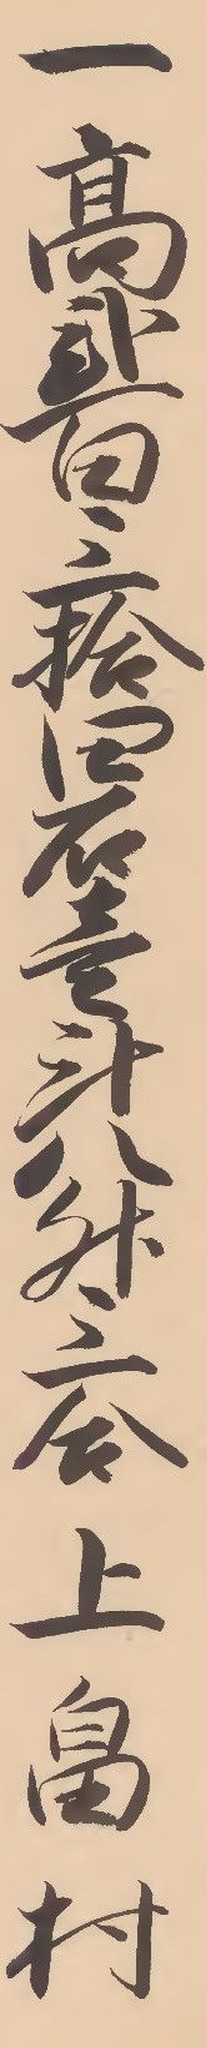一高弐百三拾四石壱斗八升三合上畠村
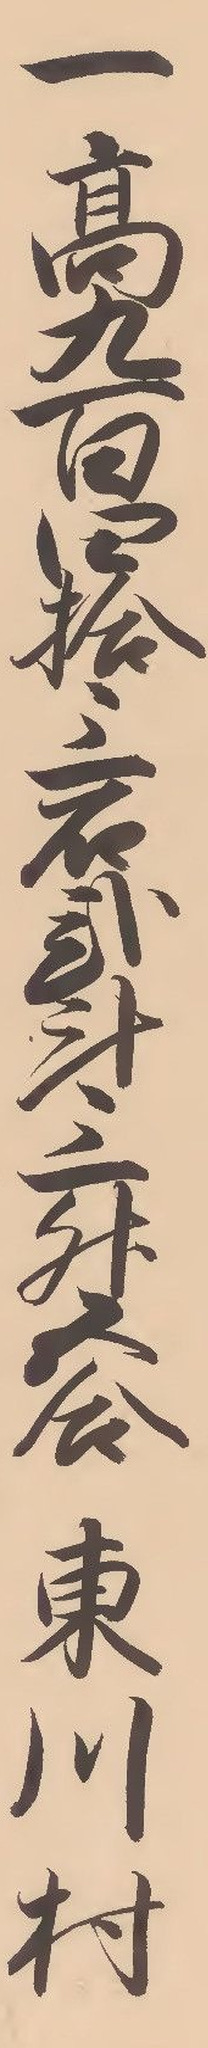一高九百四拾三石弐斗三升五合東川村
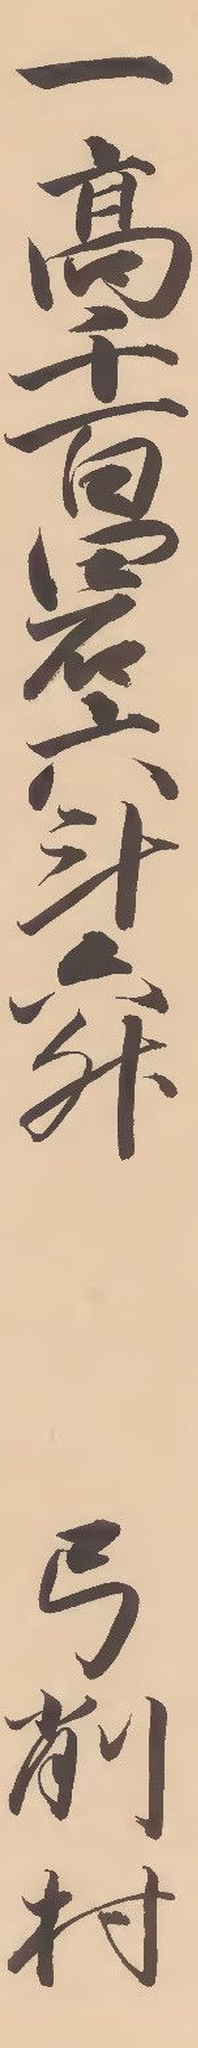一高千百四石六斗六升弓削村
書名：近江国郷帳
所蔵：国立公文書館 National Archives of Japan
